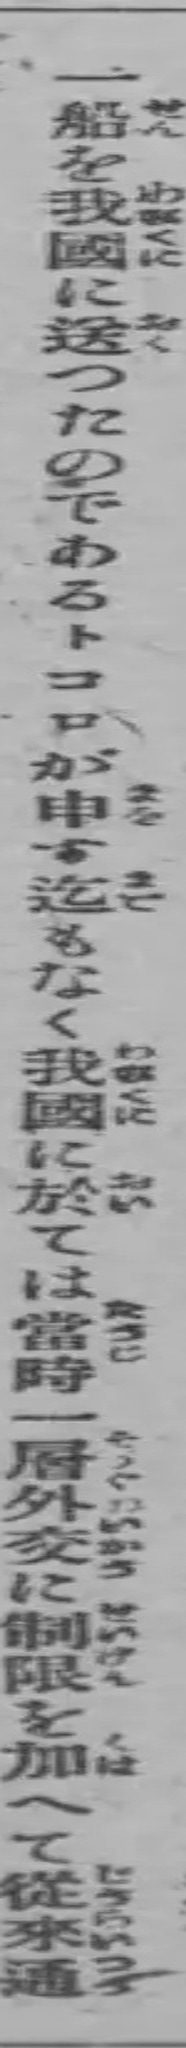一船を我国に送つたのであるトコロが申す迄もなく我国に於ては当時一層外交に制限を加へて従来通
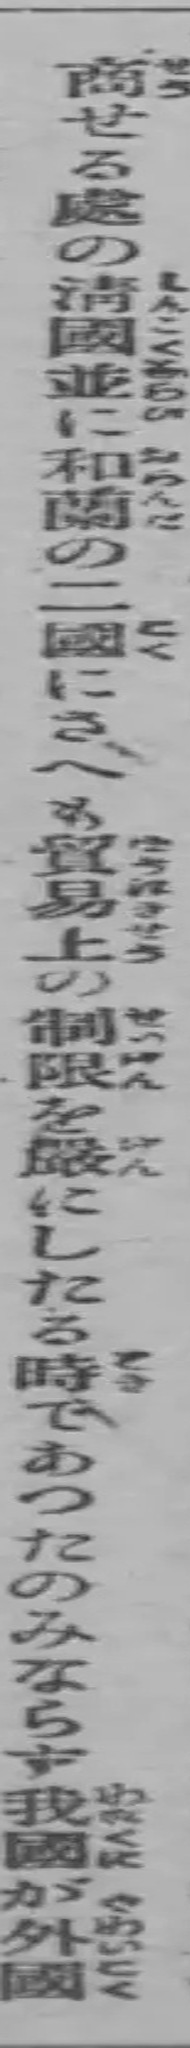商せる処の清国並に和蘭の二国にさへも貿易上の制限を厳にしたる時であつたのみならず我国が外国
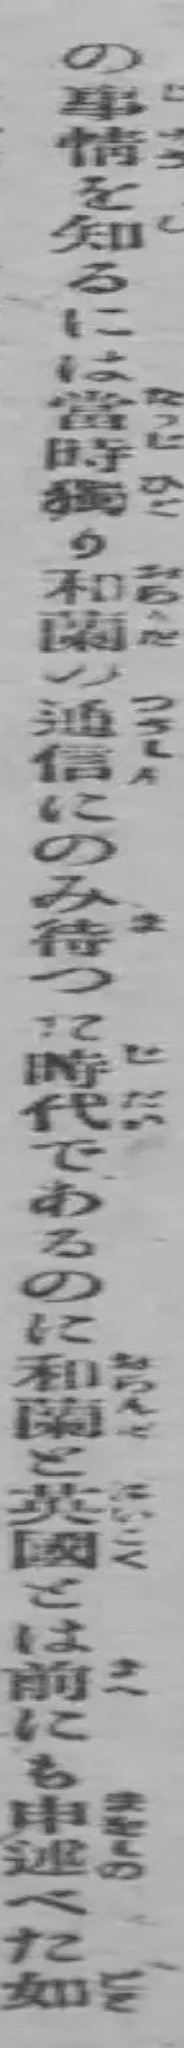の事情を知るには当時独り和蘭の通信にのみ待つた時代であるのに和蘭と英国とは前にも申述べた如
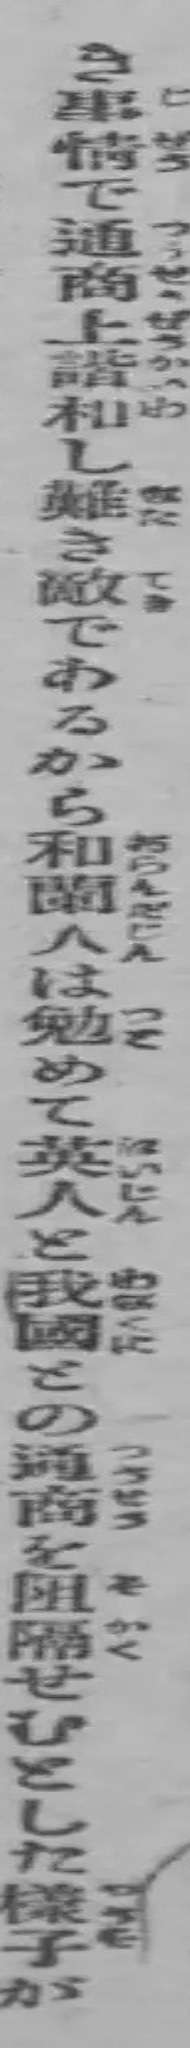き事情で通商上講和し難き敵であるから和蘭人は勉めて英人と我国との通商を阻隔せむとした様子が
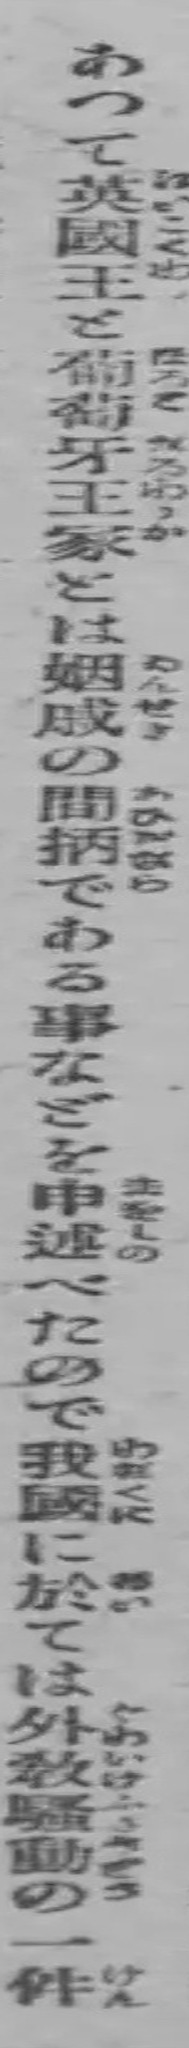あつて英国王と葡萄牙王家とは姻戚の間柄である事などを申述べたので我国に於ては外教騒動の一件
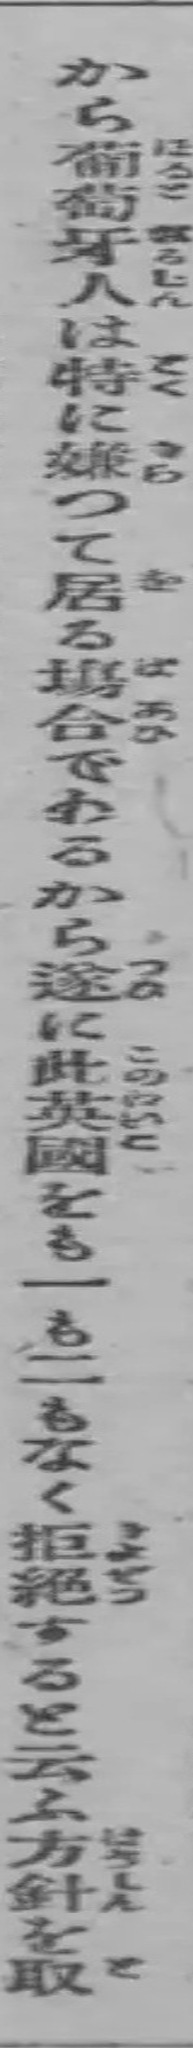から葡萄牙人は特に嫌つて居る場合であるから遂に此英国をも一も二もなく拒絶すると云ふ方針を取
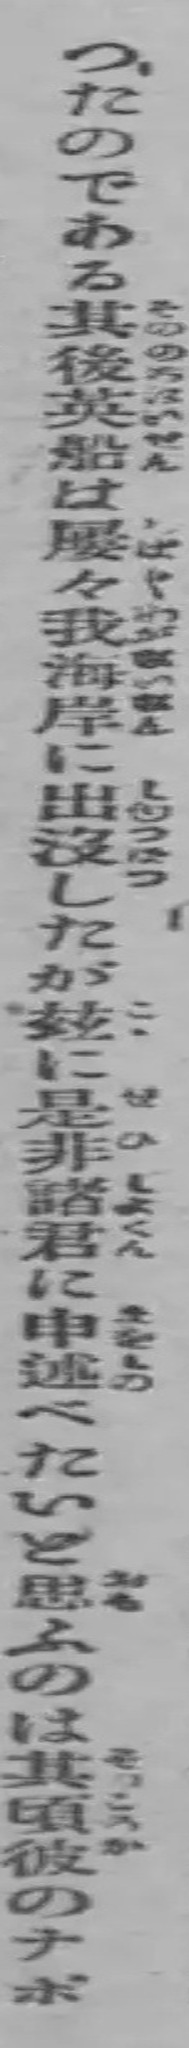つたのである其後英船は屡々我海岸に出没したが茲に是非諸君に申述べたいと思ふのは其頃彼のナポ
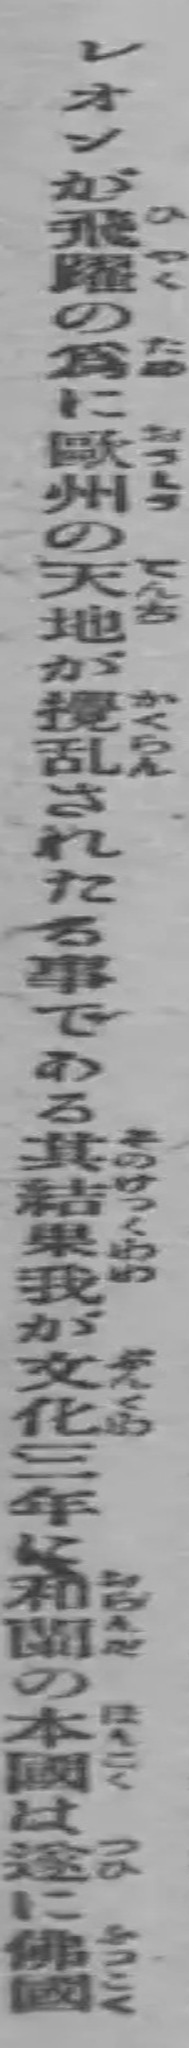レオンが飛躍の為に欧州の天地が攪乱されたる事である其結果我が文化三年に和蘭の本国は遂に仏国

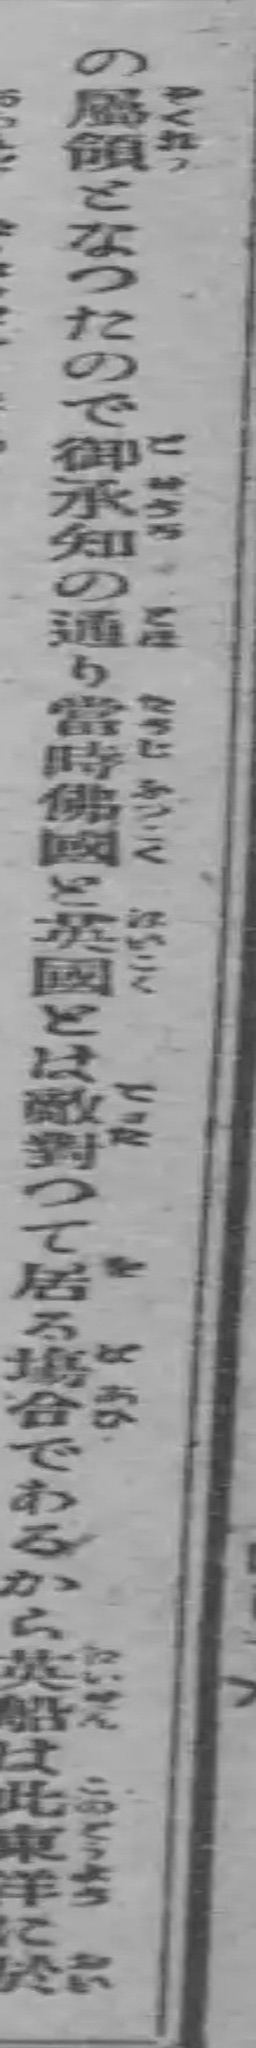の属領となつたので御承知の通り当時仏国と英国とは敵対つて居る場合であるから英船は此東洋に於
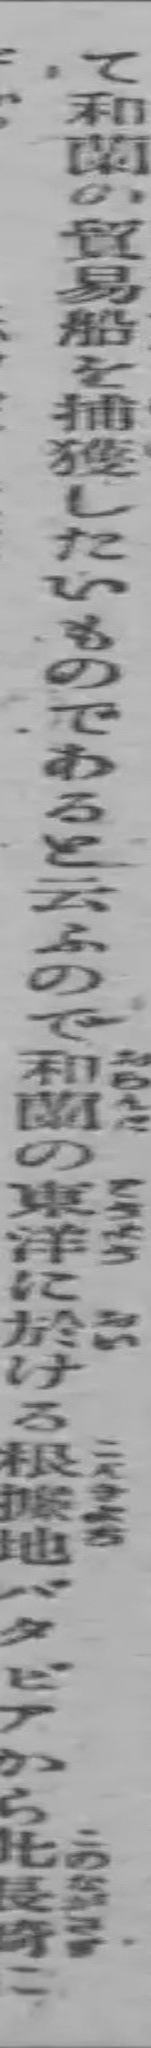て和蘭の貿易船を捕獲したいものであると云ふので和蘭の東洋に於ける根拠地バタビアから此長崎に
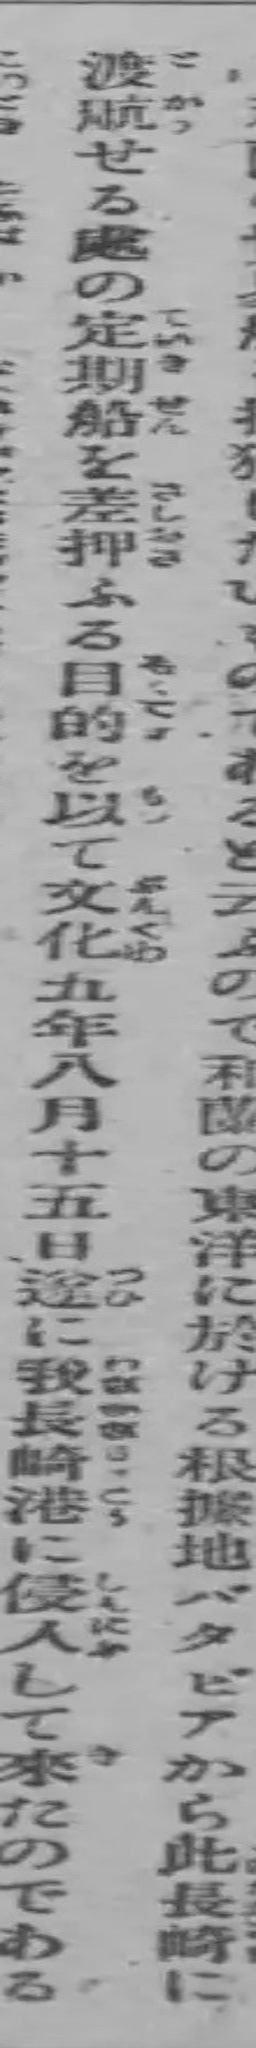渡航せる処の定期船を差押ふる目的を以て文化五年八月十五日遂に我長崎港に侵入して来たのである
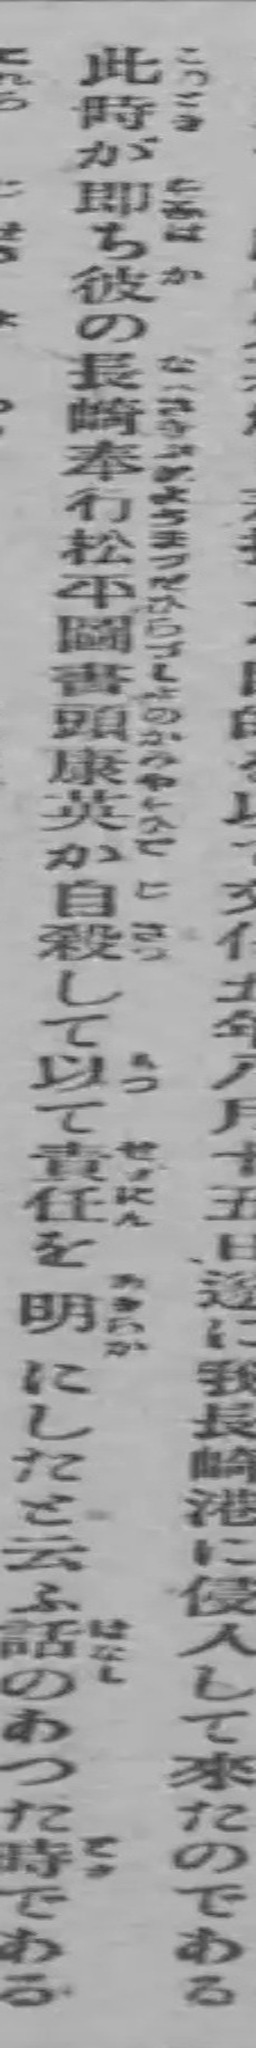此時が即ち彼の長崎奉行松平図書頭康英が自殺して以て責任を明にしたと云ふ話のあつた時である
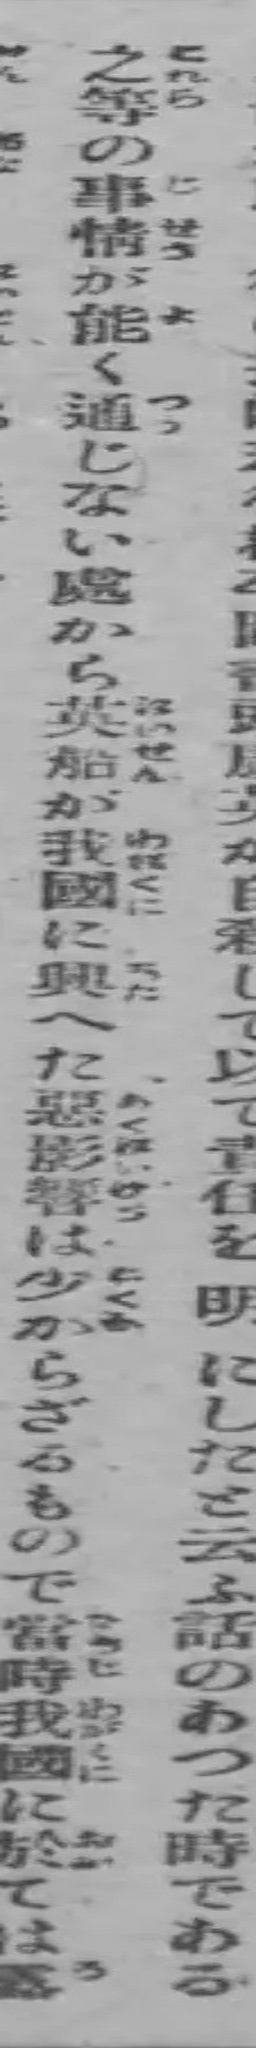之等の事情が能く通じない処から英船が我国に与へた悪影響は少からざるもので当時我国に於ては露
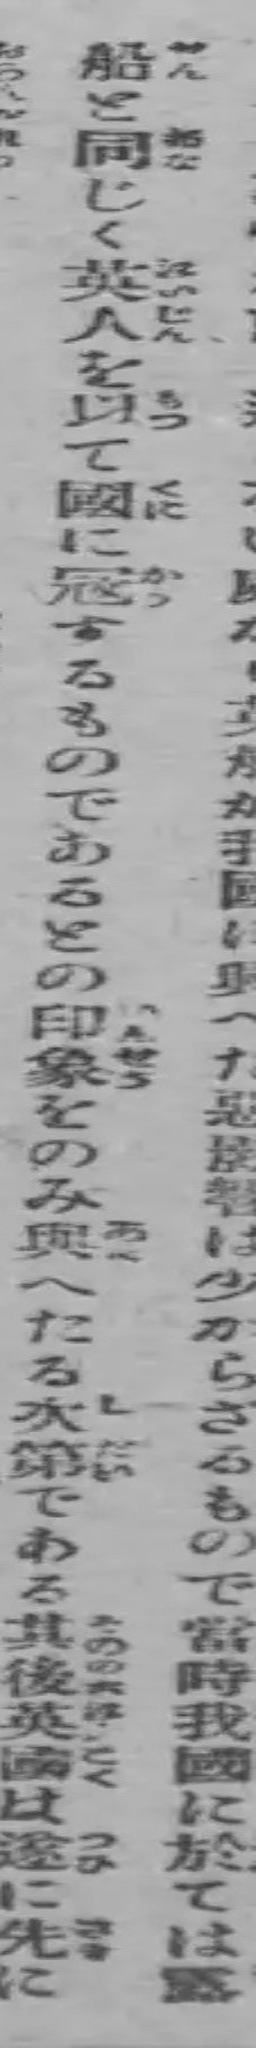船と同じく英人を以て国に寇するものであるとの印象をのみ与へたる次第である其後英国は遂に先に
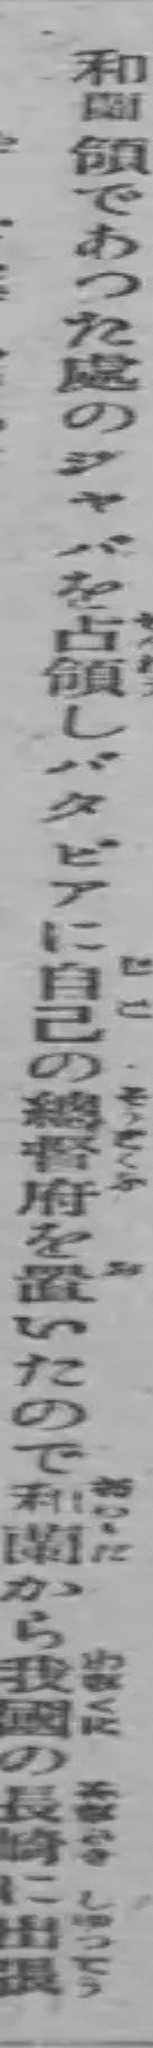和蘭領であつた処のジャバを占領しバタビアに自己の総督府を置いたので和蘭から我国の長崎に出張
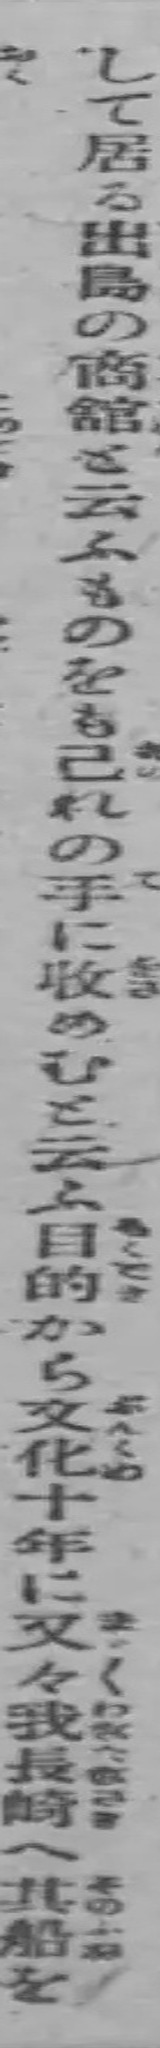して居る出島の商館と云ふものをも己れの手に収めむと云ふ目的から文化十年に又々我長崎へ其船を
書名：豊橋市史談
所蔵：国立国会図書館 National Diet Library, JAPAN
